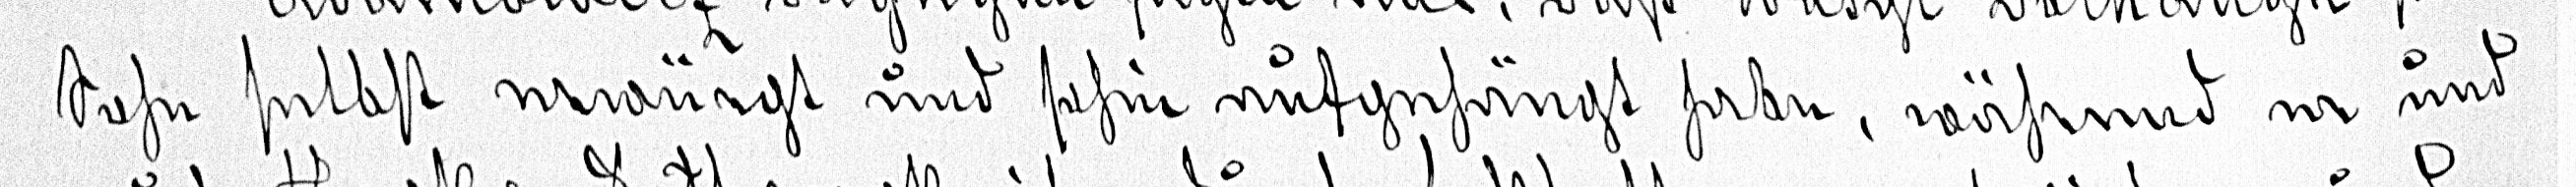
Sohn selbst erwürgt und sohin aufgehängt habe, während er und
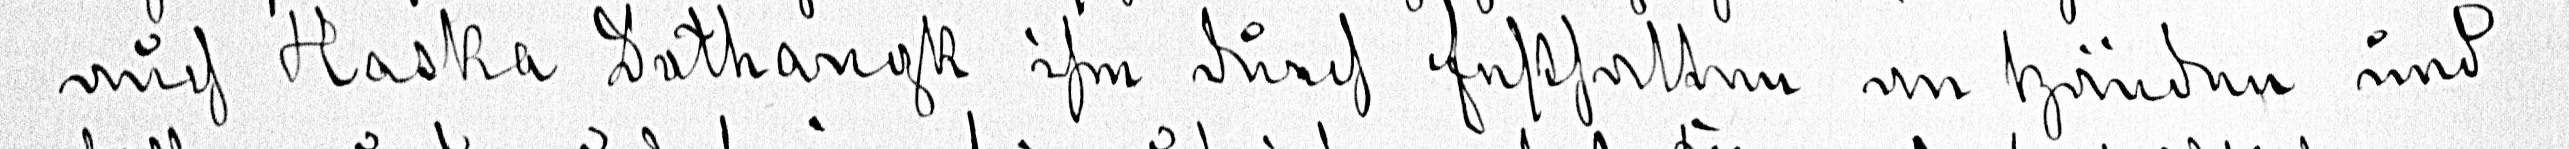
auch Haska Dothanyk ihm durch Festhalten an Händen und
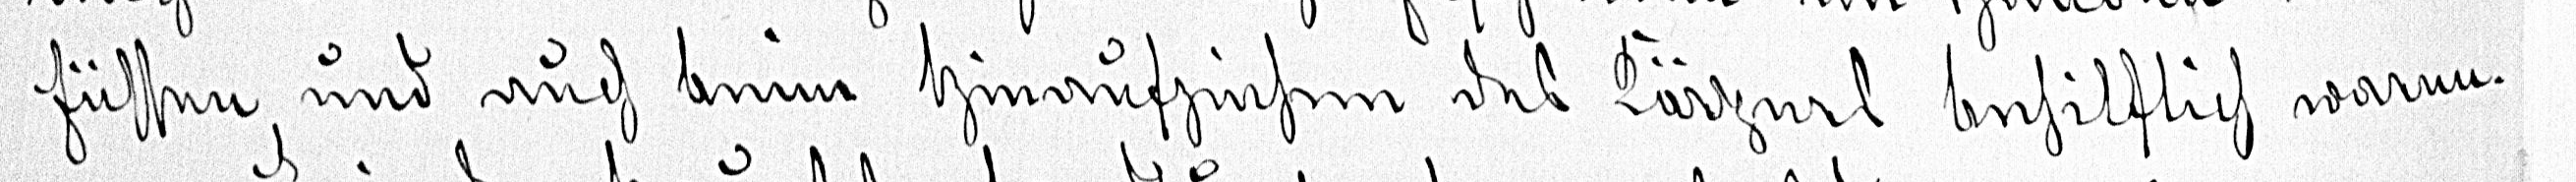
Füssen und auch beim Hinaufziehen des Körpers behilflich waren.
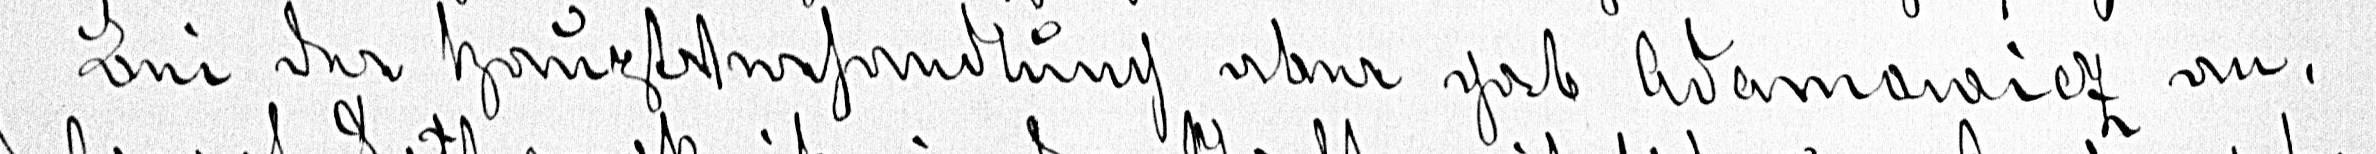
Bei der Hauptverhandlung aber gab Adamowicz an,
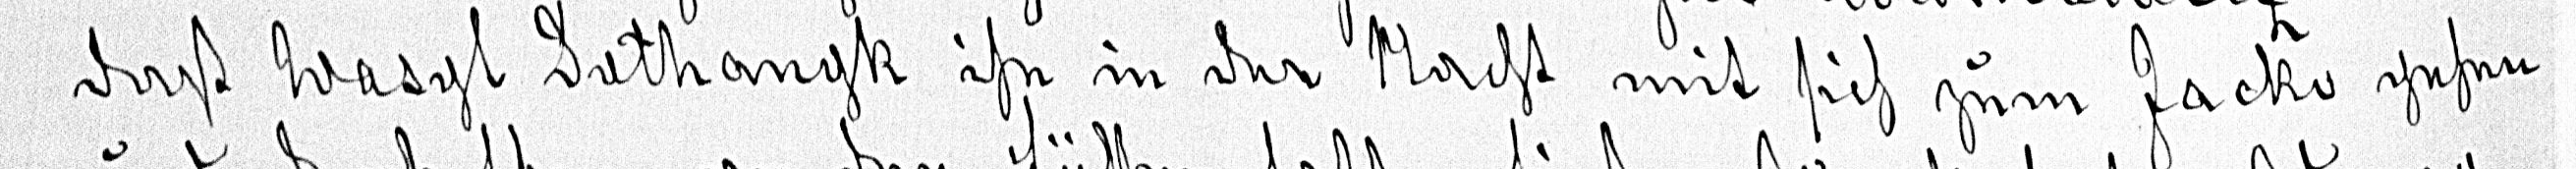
daß Wasyl Dothanyk ihn in der Nacht mit sich zum Jacko gehen
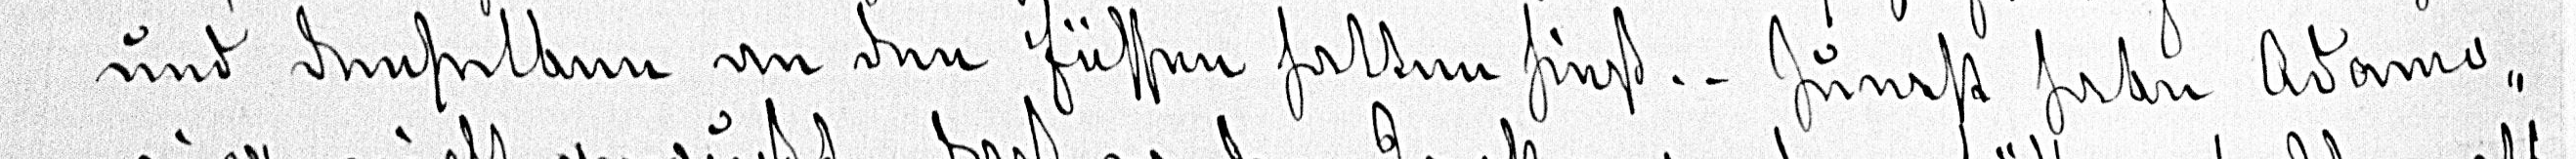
und denselben an den Füssen hatten hieß.- Zuerst habe Adamo¬
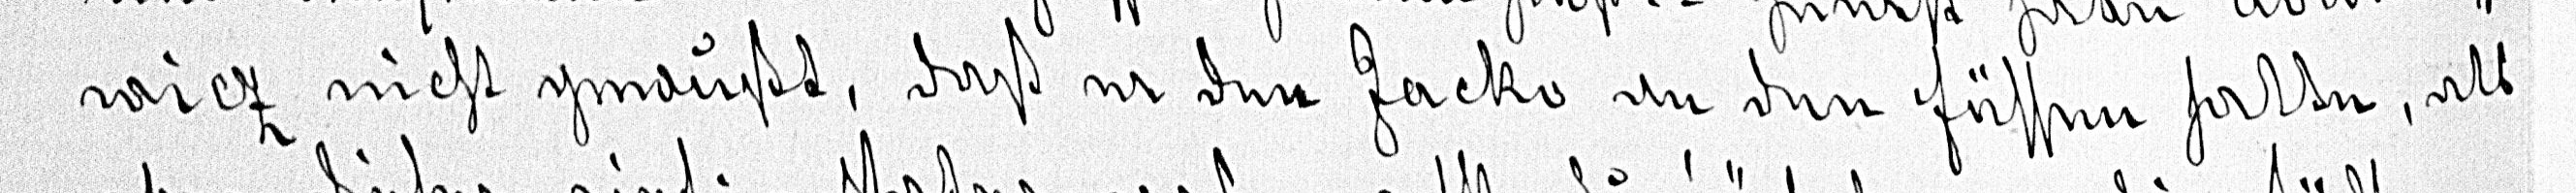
wicz nicht gewußt, daß er den Jacko an den Füssen hatte, als
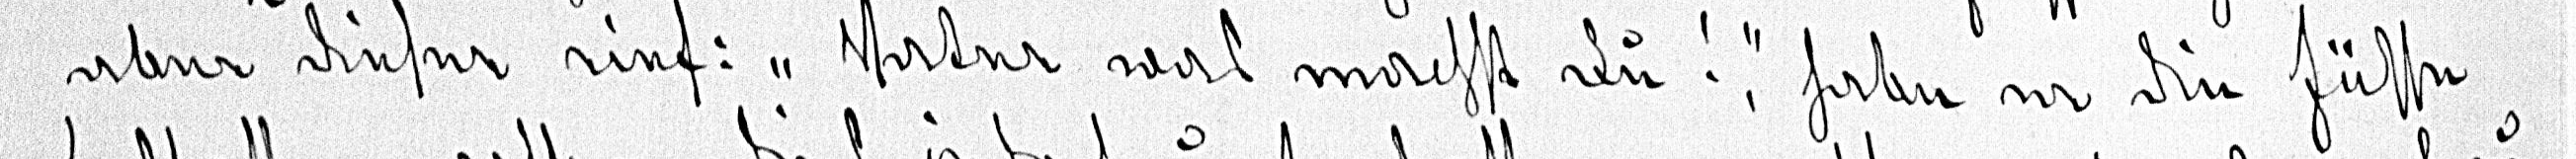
aber dieser einf: „Vater was machst Du!“, habe er die Füsse
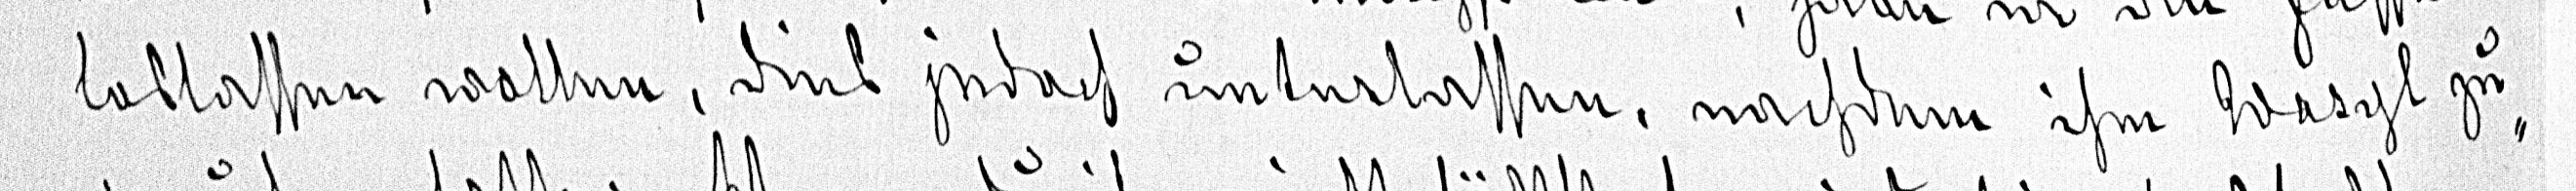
loslassen wollen, dies jedoch unterlassen, nachdem ihm Wasyl zu¬
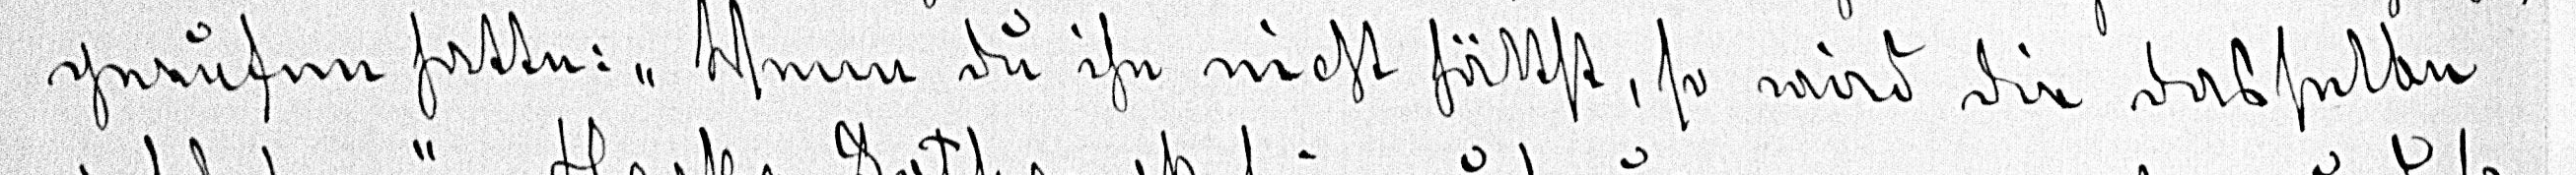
gerufen hatte: „Wenn du ihn nicht fällst, so wird die dasselbe
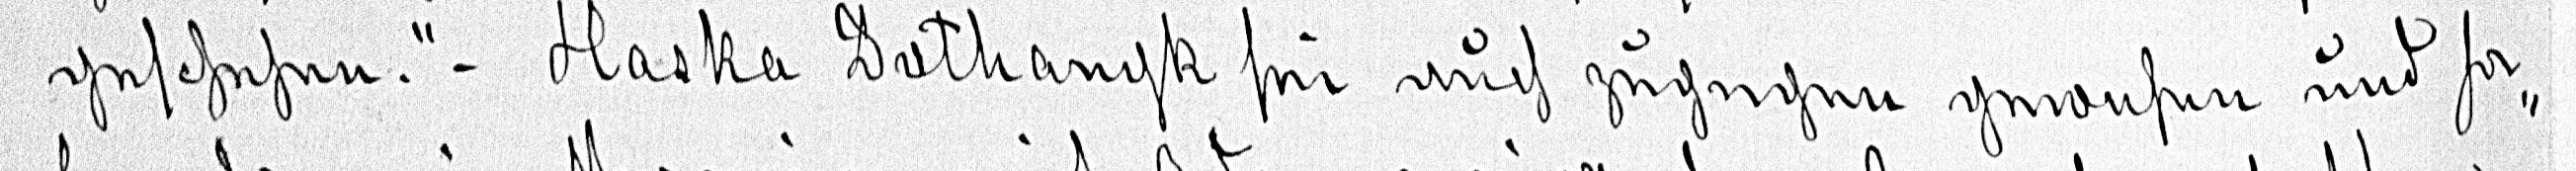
geschehen.“- Haska Dothanyk sei auch zugegen gewesen und ha¬
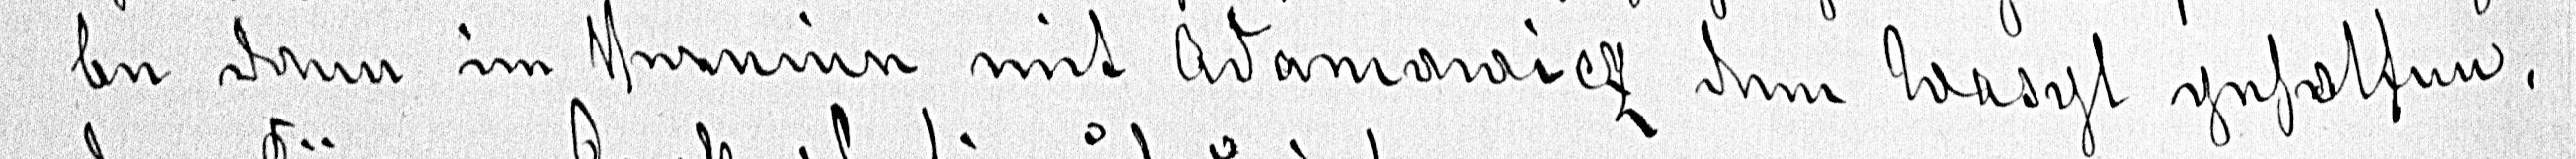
be dann im Vereine mit Adamowicz dem Wasyl geholfen,
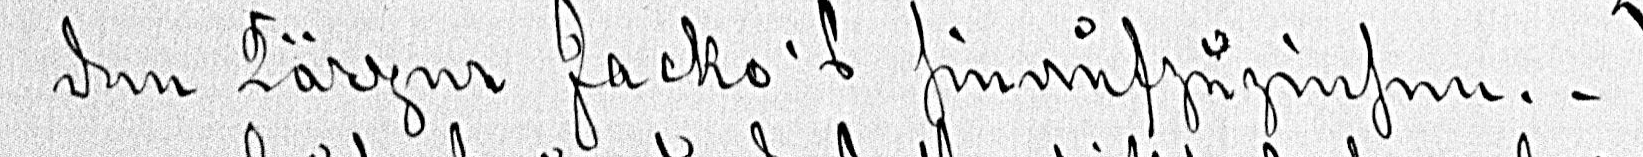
den Kärper Jacko's hinaufzuziehen.
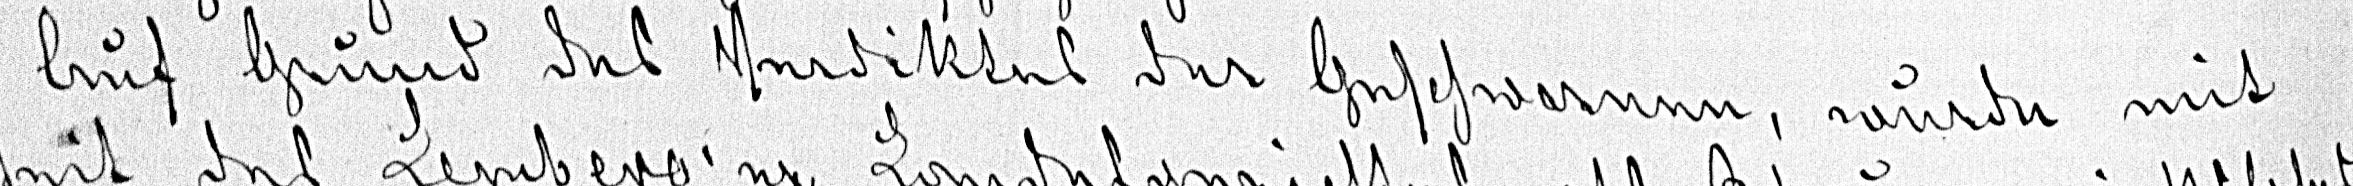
Auf Grund des Verdiktes der Geschwornen, wurde mit
